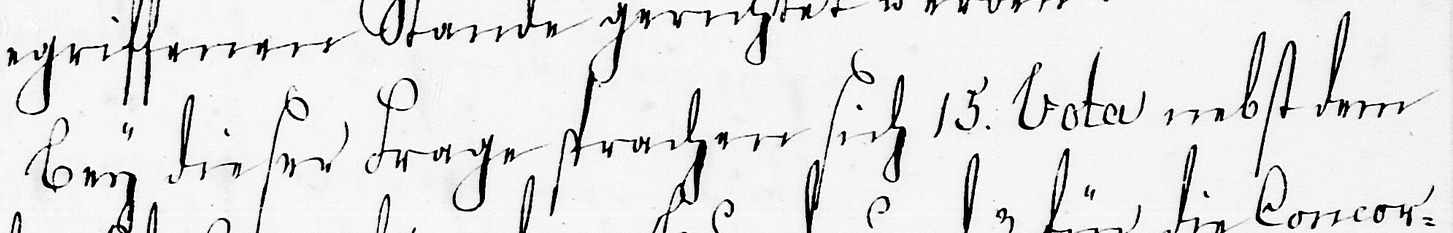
Bey dieser Frage sprachen sich 15. Vota nebst dem
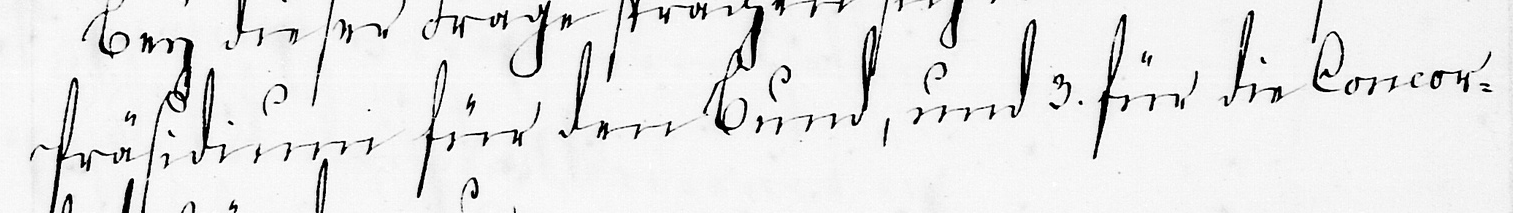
Präsidium für den Bund, und 3. für die Concor¬
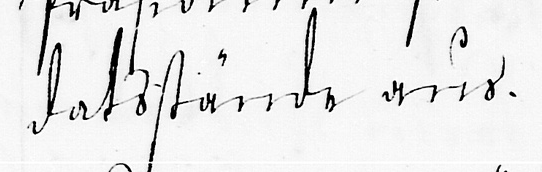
datsstände aus.
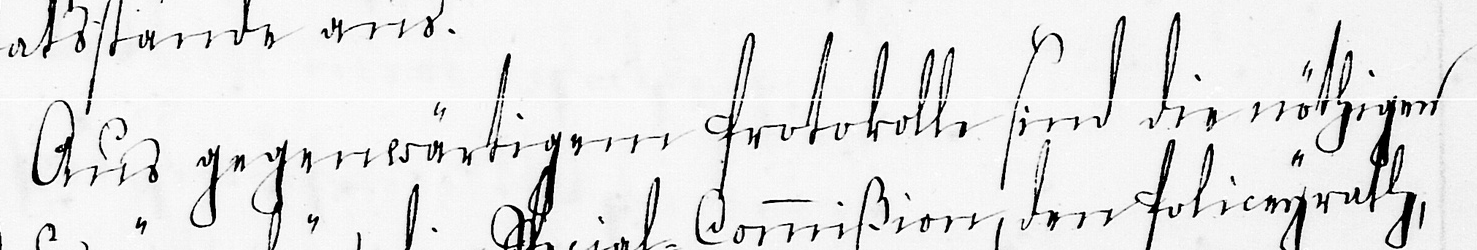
Aus gegenwärtigen Protokolle sind die nöthigen
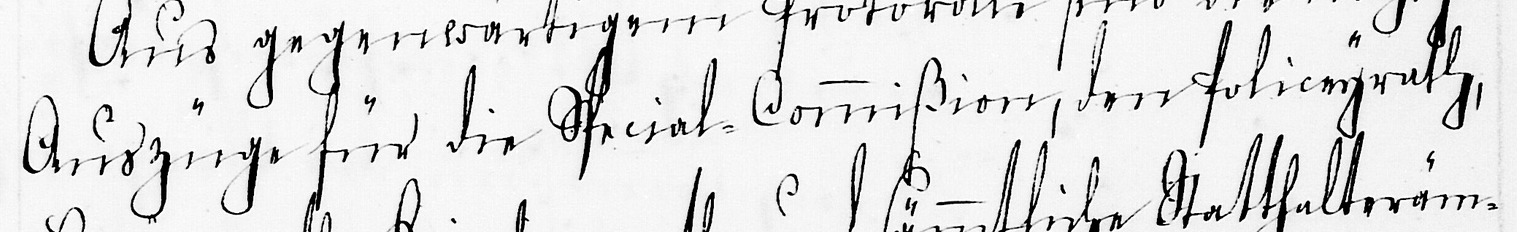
Auszüge für die Special-Commißion, den Policeyrath,
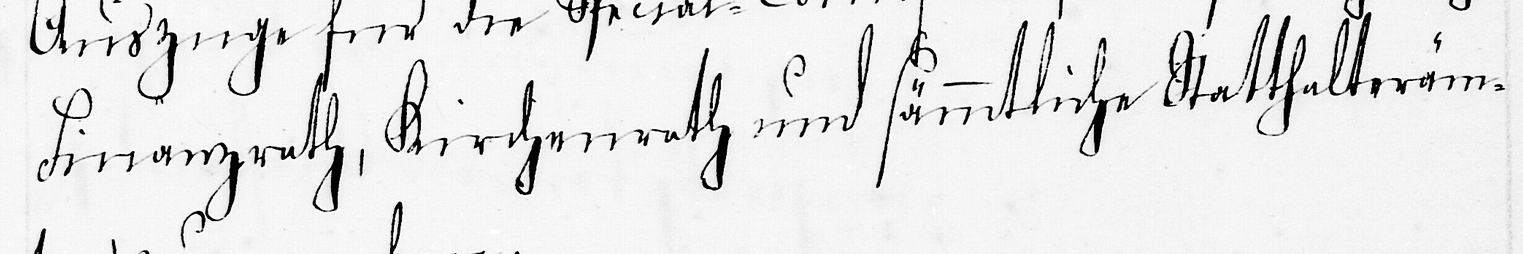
Finanzrath, Kirchenrath und sämmtliche Statthalteräm¬
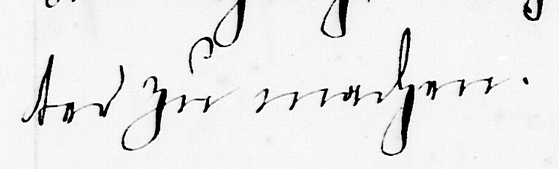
ter zu machen.
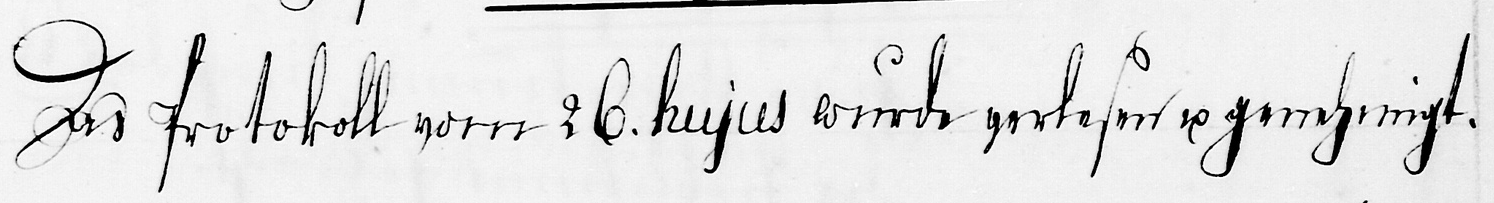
Das Protokoll vom 26. hujus wurde verlesen u. genehmigt.
